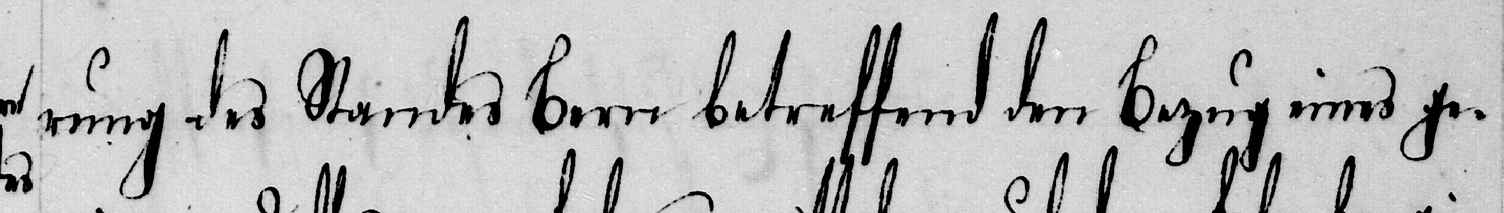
rung des Standes Bern betreffend den Bezug eines ge¬
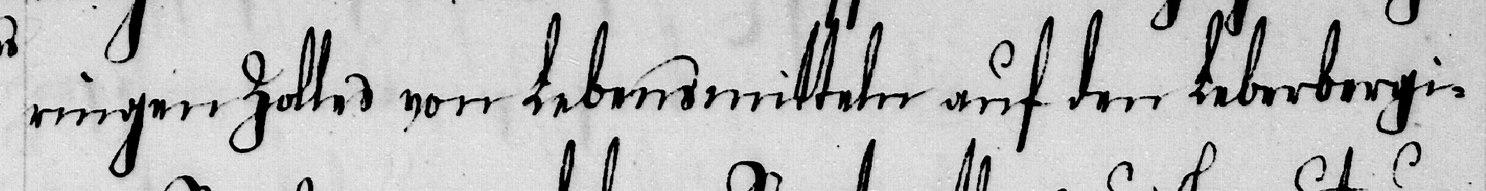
ringen Zolles von Lebensmitteln auf den Leberbergi¬
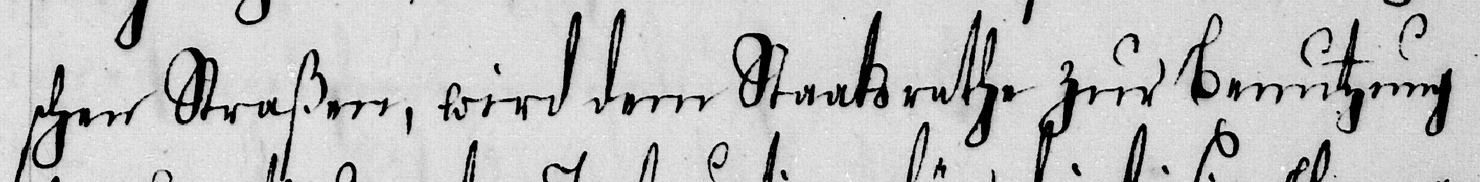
schen Straßen, wird dem Staatsrathe zur Benutzung
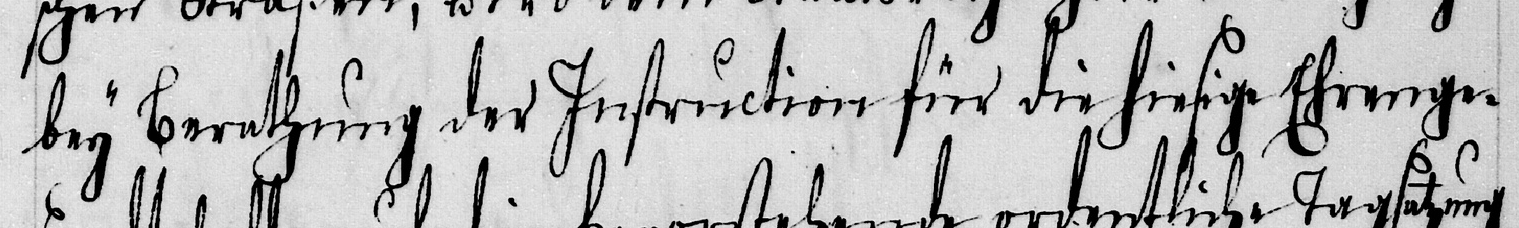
bey Berathung der Instruction für die hiesige Ehrenge¬
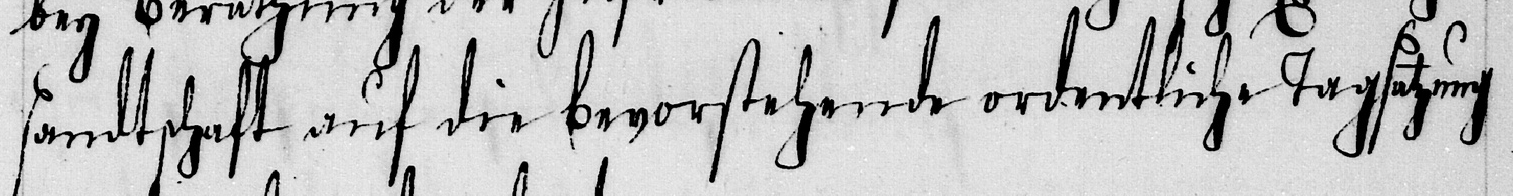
sandtschaft auf die bevorstehende ordentliche Tagsatzung
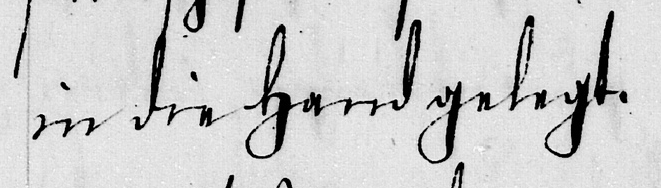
in die Hand gelegt.
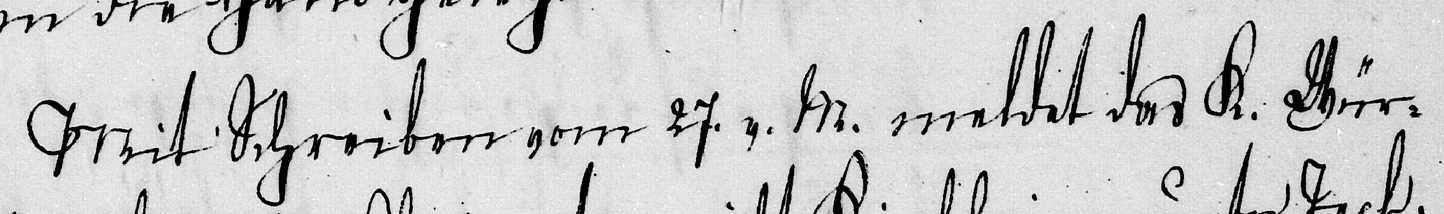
Mit Schreiben vom 27. v. M. meldet das K. Wür¬
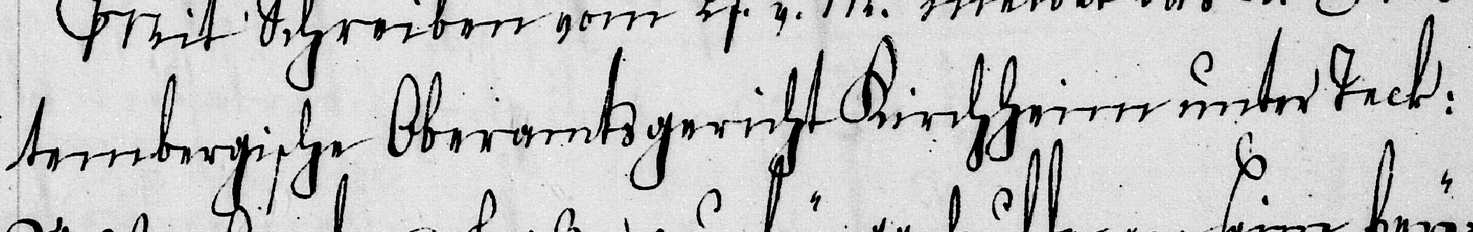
tembergische Oberamtsgericht Kirchheim unter Teck:
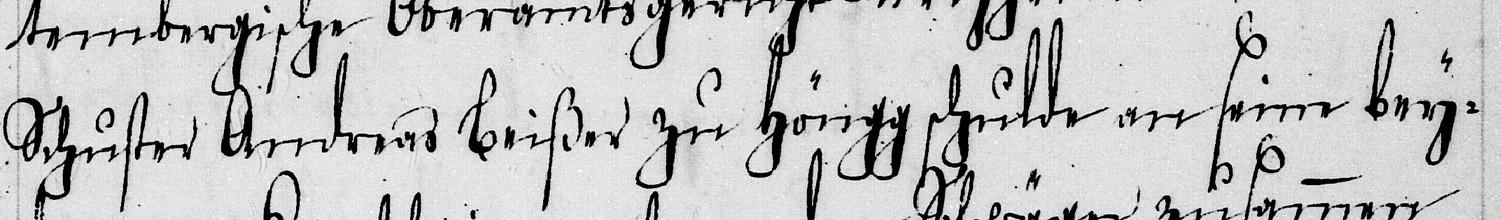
Schuster Andreas Beißer zu Höngg schulde an seine bey¬
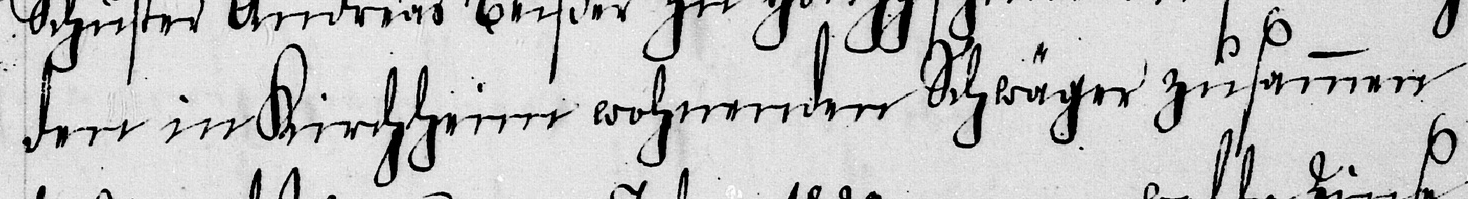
den in Kirchheim wohnenden Schwäger zusammen
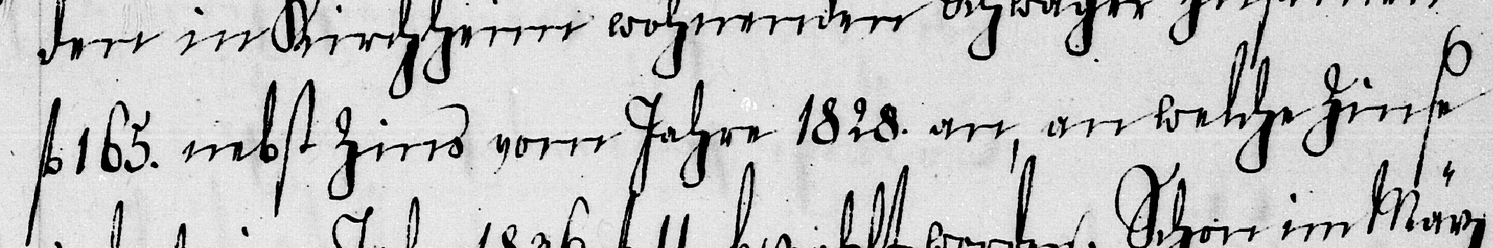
fl. 165. nebst Zins vom Jahre 1828. an, an welche Zinse
